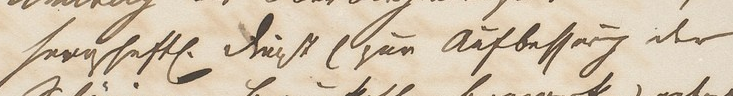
herrschaftl. Dienst (zur Aufbesserung der
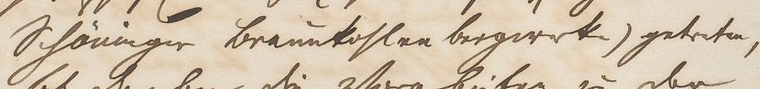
Schöninger Braunkohlen bergwerke) getreten,
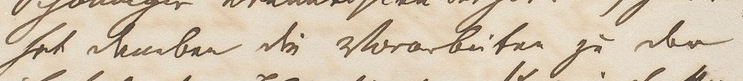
hat daneben die Vorarbeiten zu der
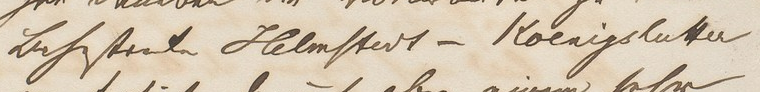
Bahnstrecke Helmstedt–Koenigslutter
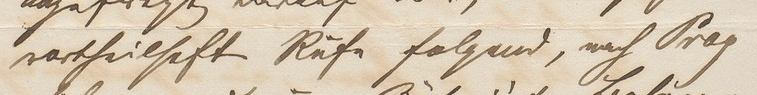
vortheilhaften Rufe folgend, nach Prag
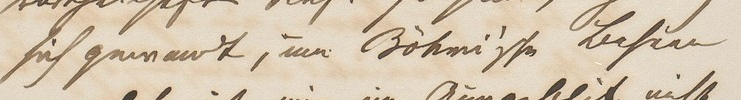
sich gewandt, um Böhmi'sche Bahnen
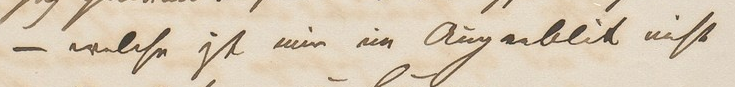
– welche ist mir im Augenblick nicht
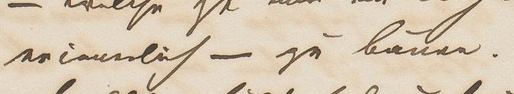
erinnerlich – zu bauen.
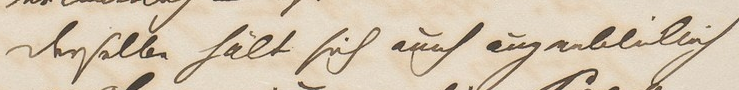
Derselbe hält sich auch augenblicklich
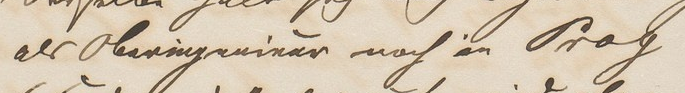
der Oberingenieur noch in Prag
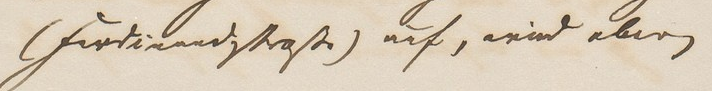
(Ferdinandstrasse) auf, er wird aber,
